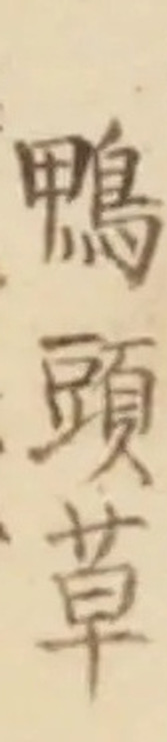鴨頭草
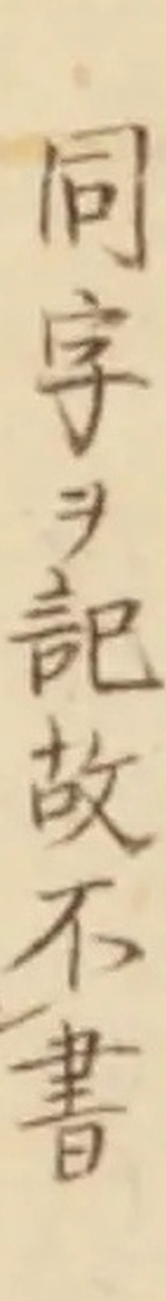同字を記故不書
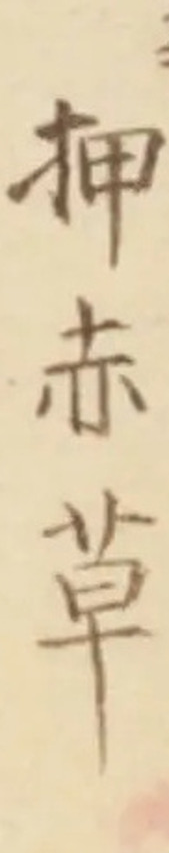押赤草
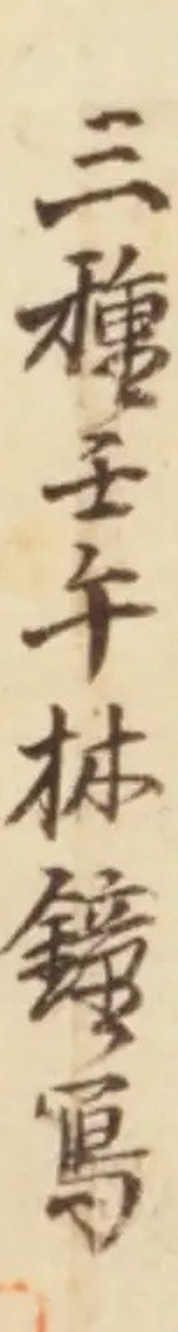三種壬午林鐘寫
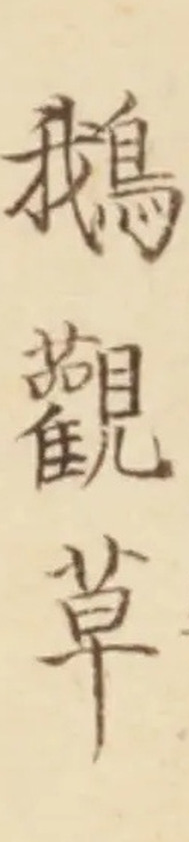鵝觀草
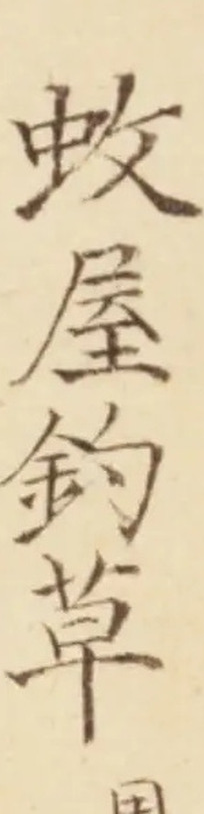蚊屋釣草
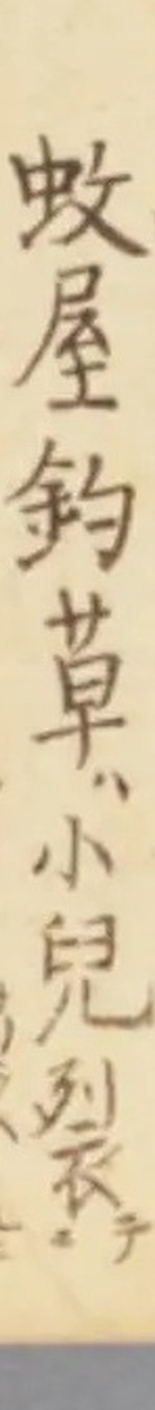蚊屋釣草は小兒裂て
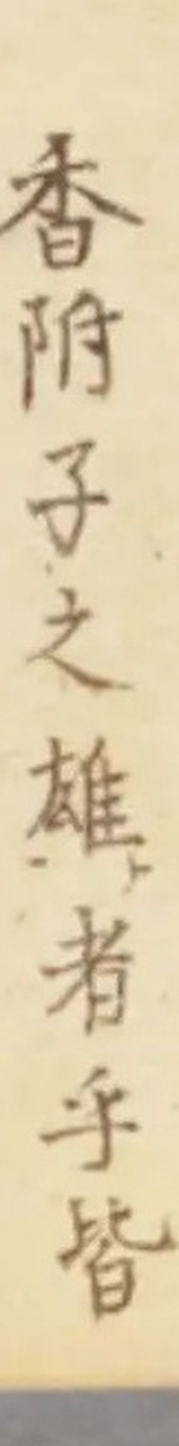香附子之雄と者乎皆
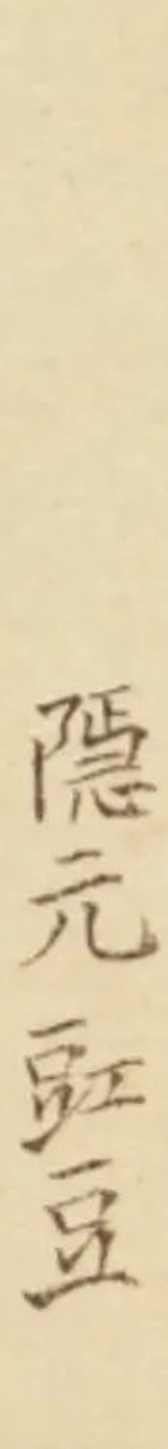隠元豇豆
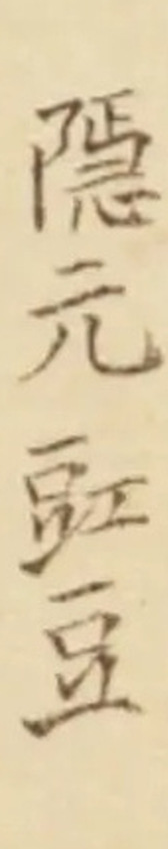隠元豇豆
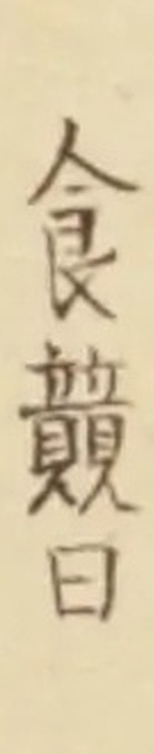食競曰
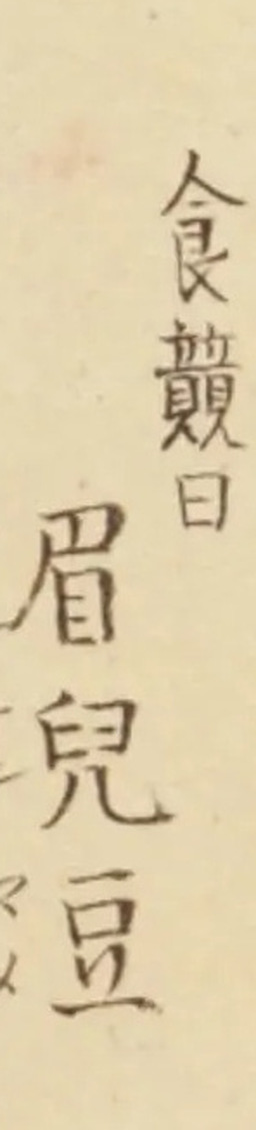眉兒豆
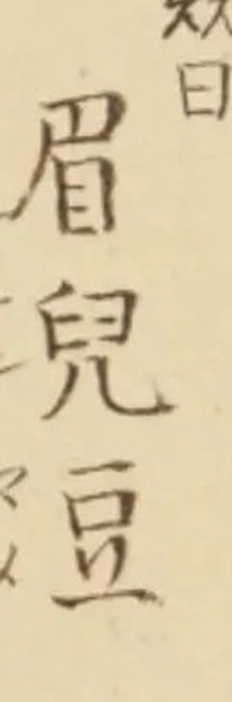眉兒豆
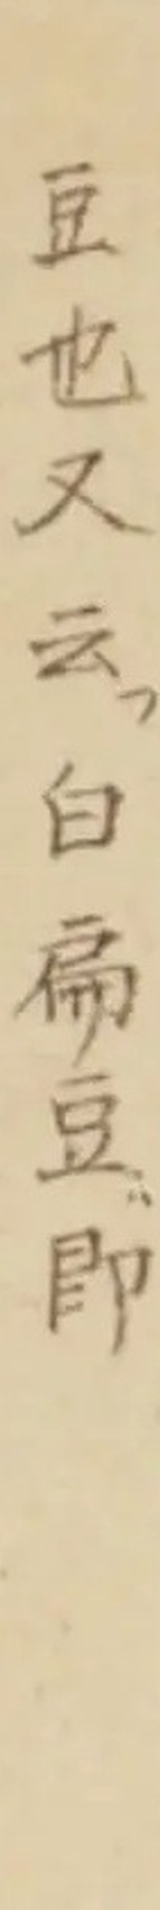豆也又云白萹豆は即
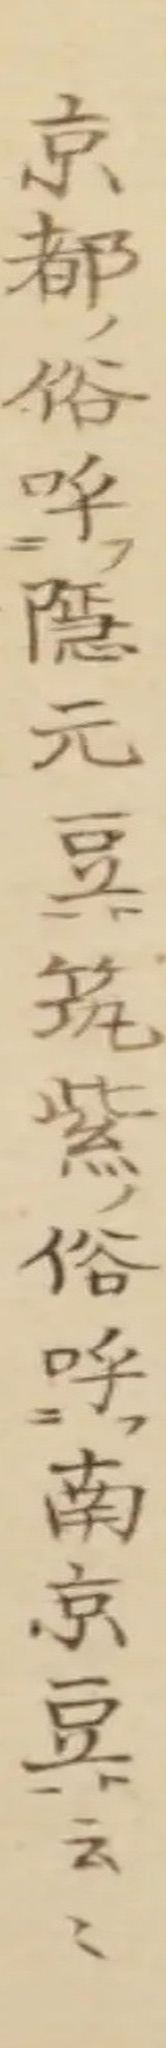京都の俗呼隠元豆と筑紫の俗呼を南京豆と云々

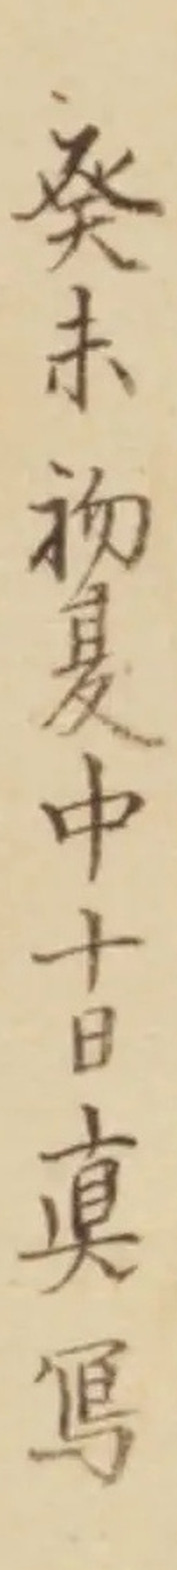癸未初夏中十日真寫
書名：梅園草木花譜夏之部. 1
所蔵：国立国会図書館 National Diet Library, JAPAN
